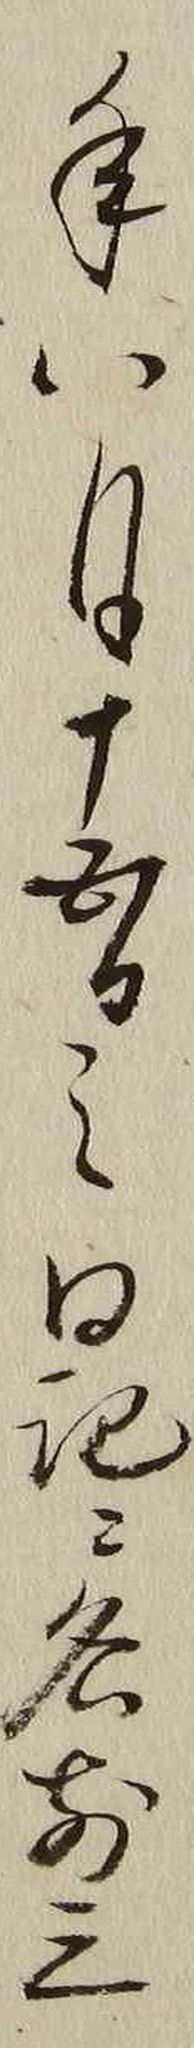年八月十五日之日記ニ名前三
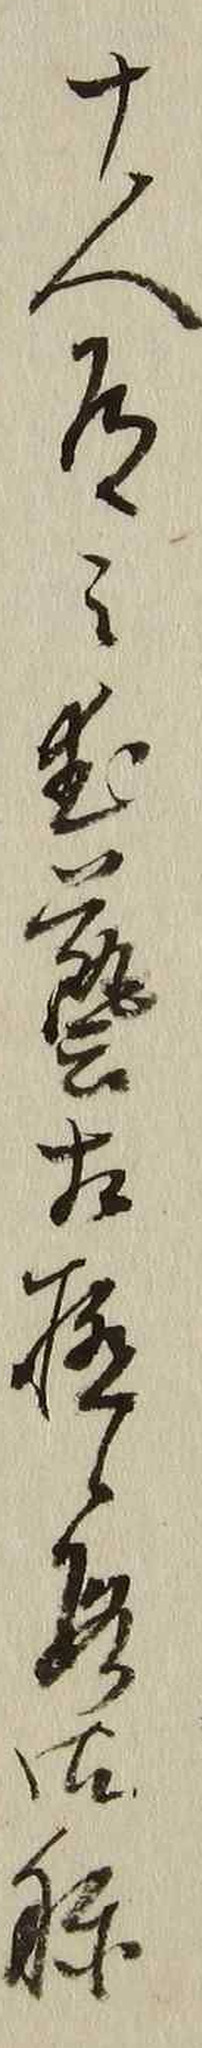十人有之武芸相極候段御称
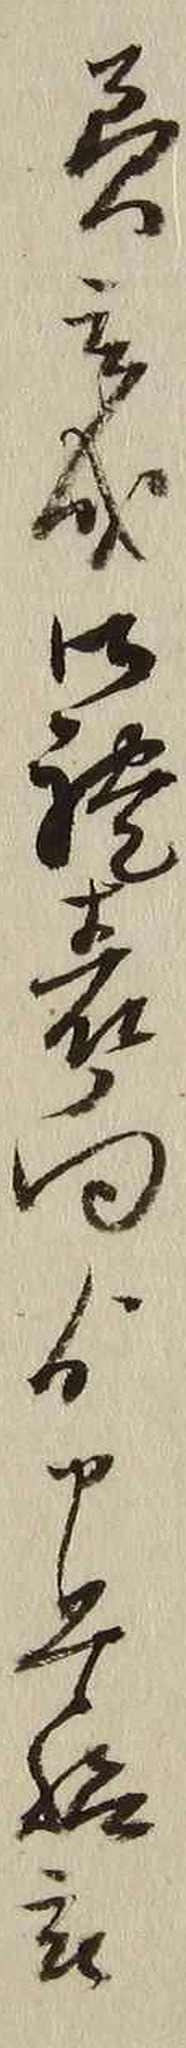美被成御礼表向ゟ申上候様被
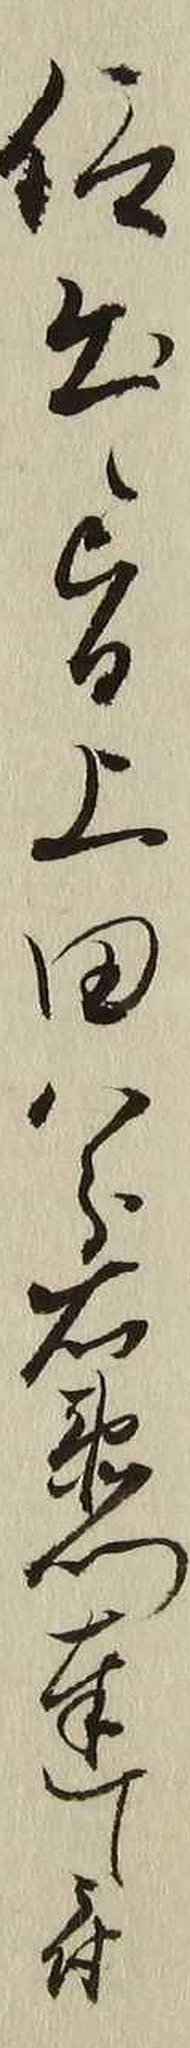仰出候旨上田八郎右衛門達候ニ付
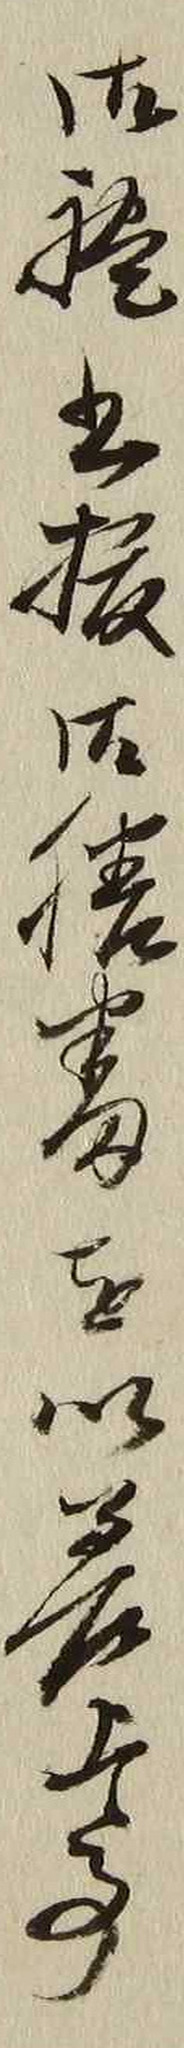御礼書抜御膳番を以差上候事
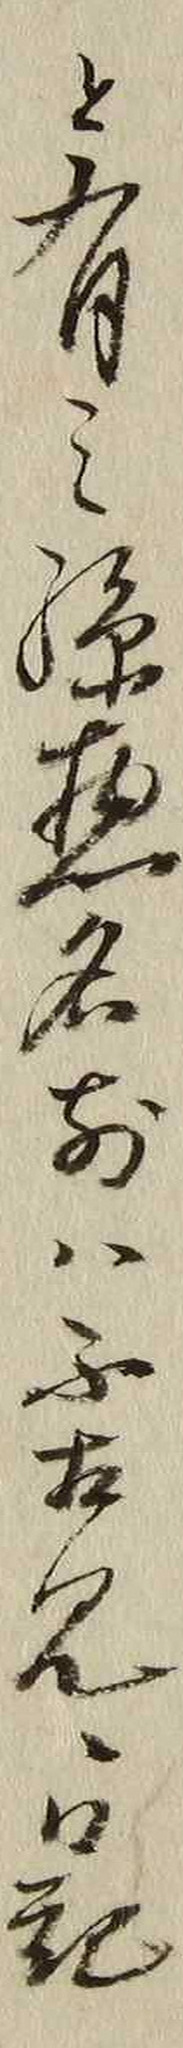と有之孫惣名前ハ不相見候日記
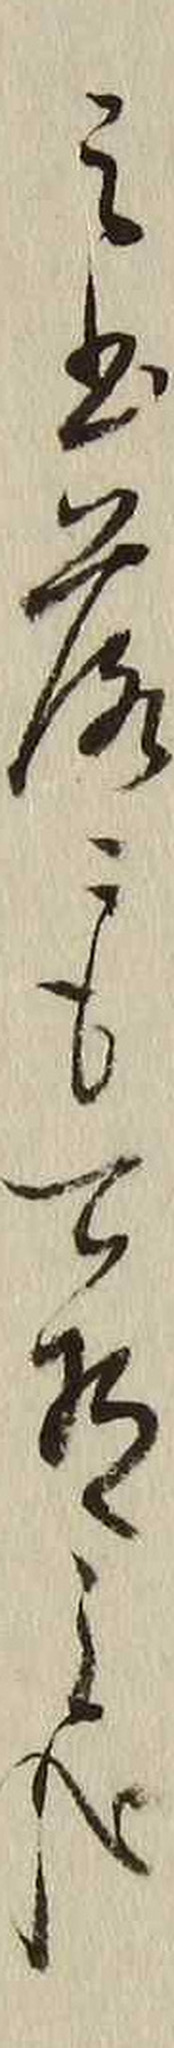之書落ニも可有之哉
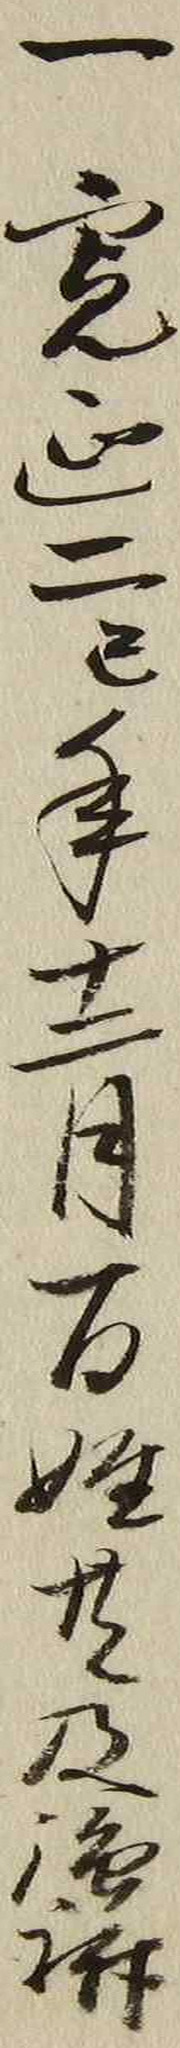一寛延二巳年十二月百姓共及強訴
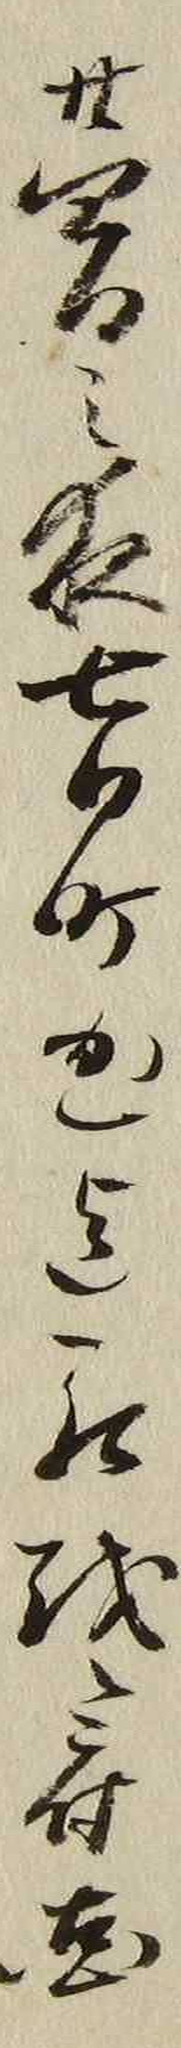廿四日之夜七日町辺迄罷越候ニ付固
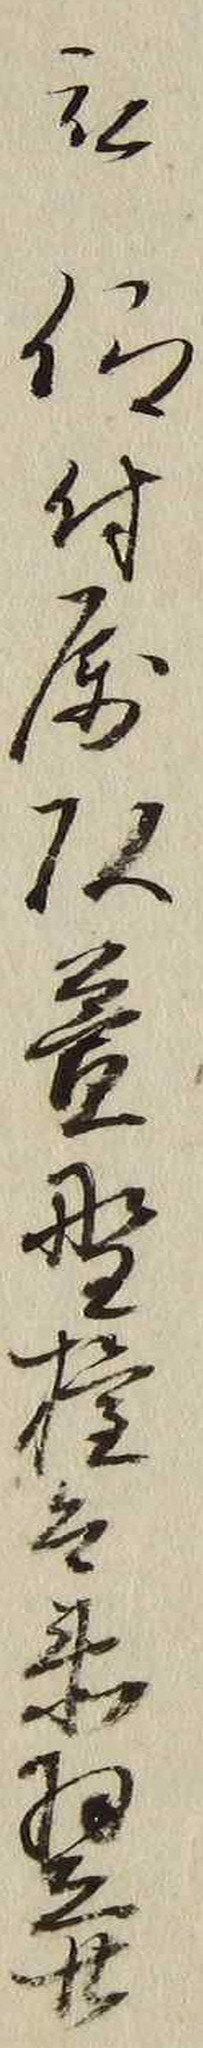被仰付属頭萱野権兵衛翌廿
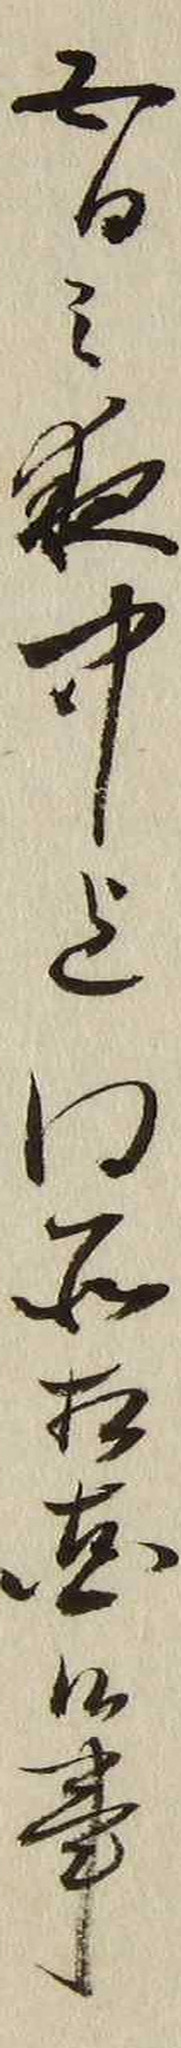五日之夜中迄同所相固候事
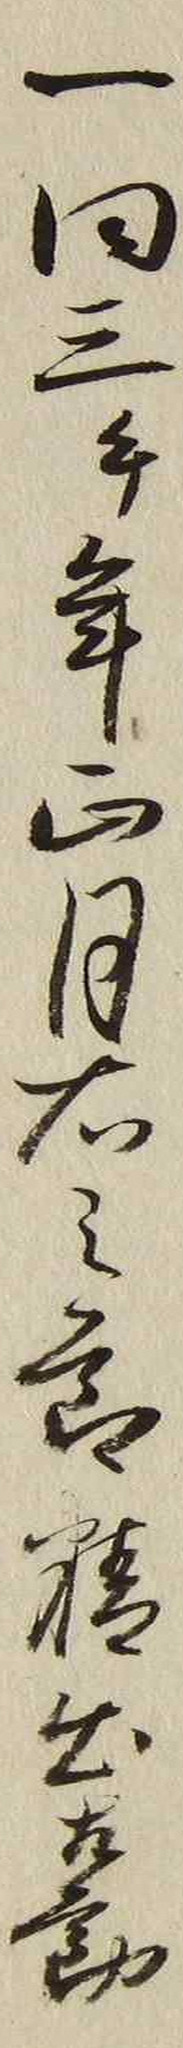一同三午年正月右之節精出相勤
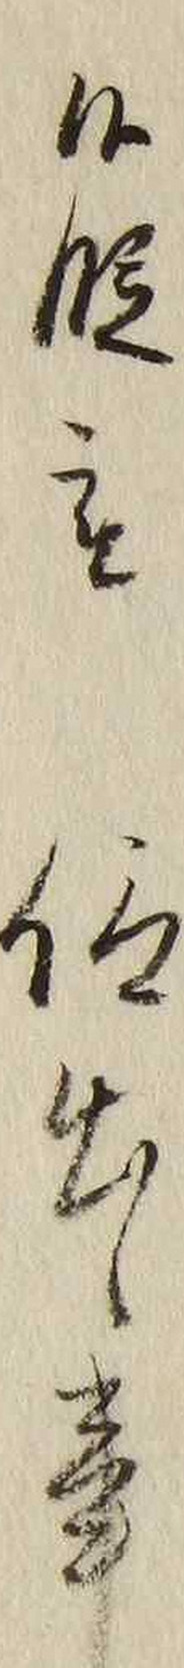候段被仰出候事

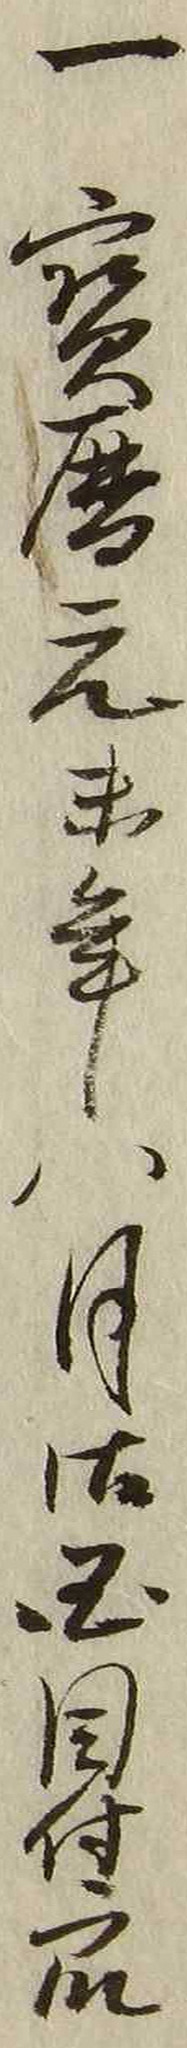一宝暦元未年八月御国目付衆
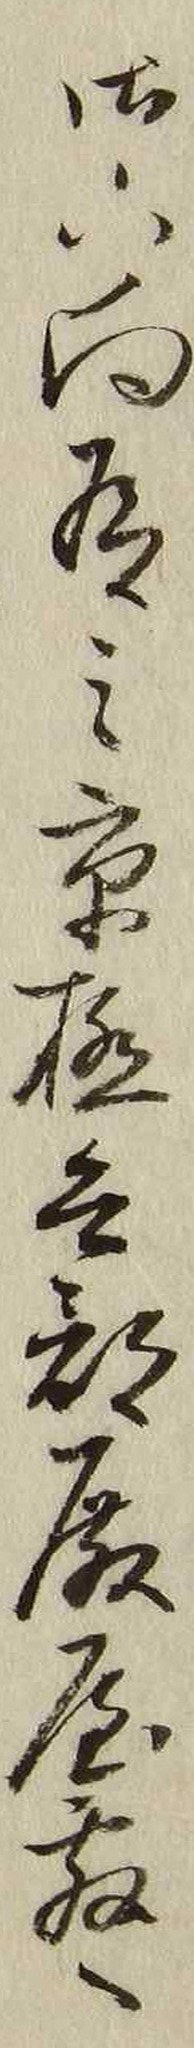御下向有之京極兵部殿屋敷へ
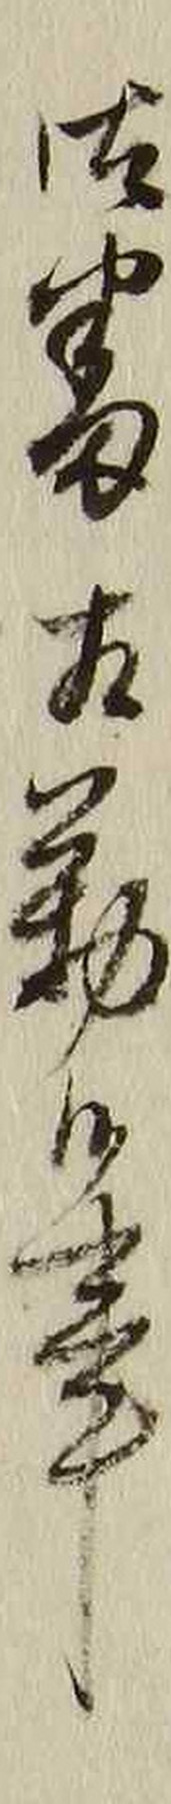御番相勤候事
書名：諸士系譜　巻之352　す之部2
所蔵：会津若松市立会津図書館
